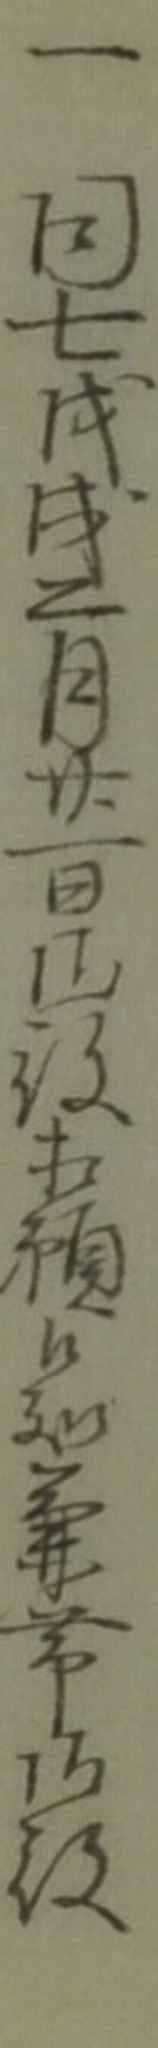一同七戊戌二月廿一日御役相願候処兼帯御役
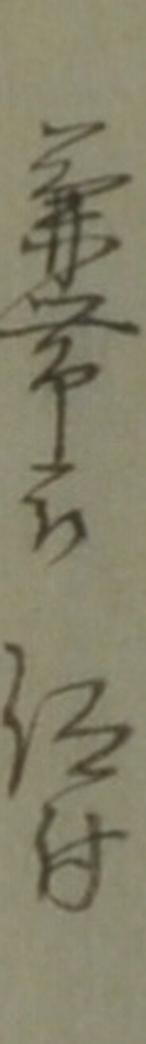兼帯被仰付
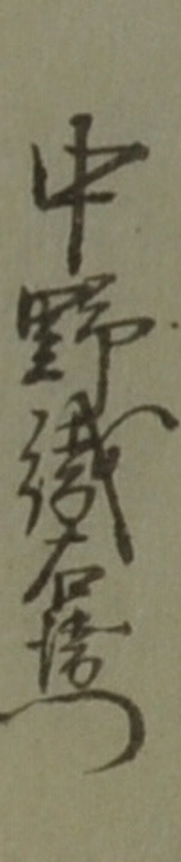中野織右衛門
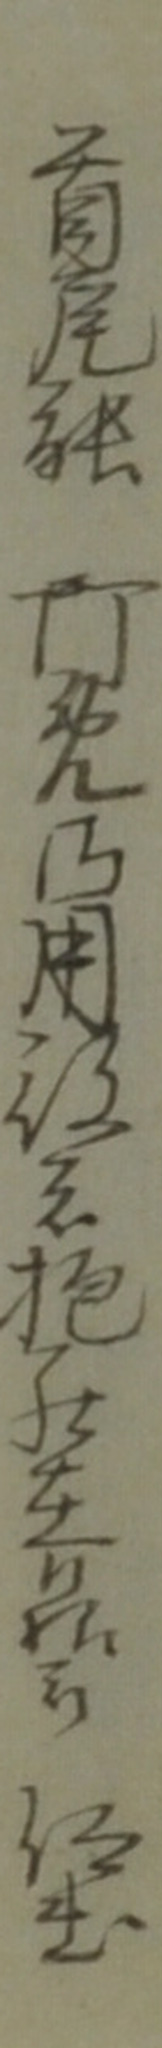首尾能御免御用役者抱罷在候様被仰出
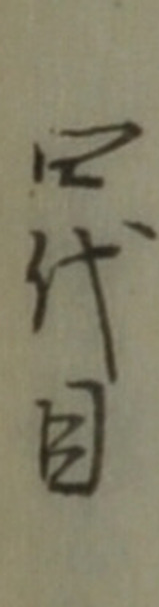四代目
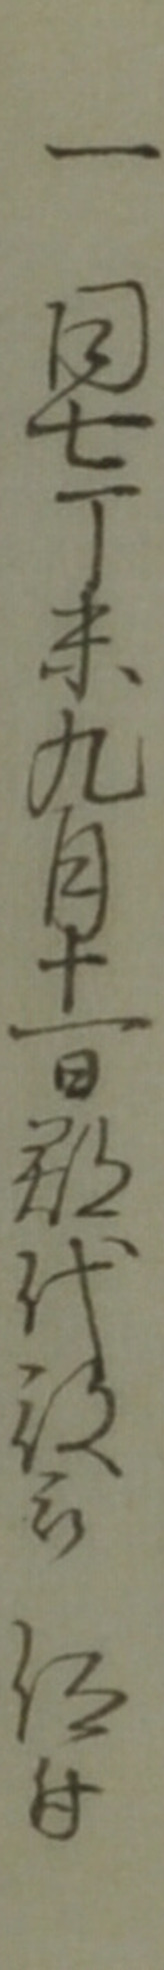一同七丁未九月十一日郡代役被仰付
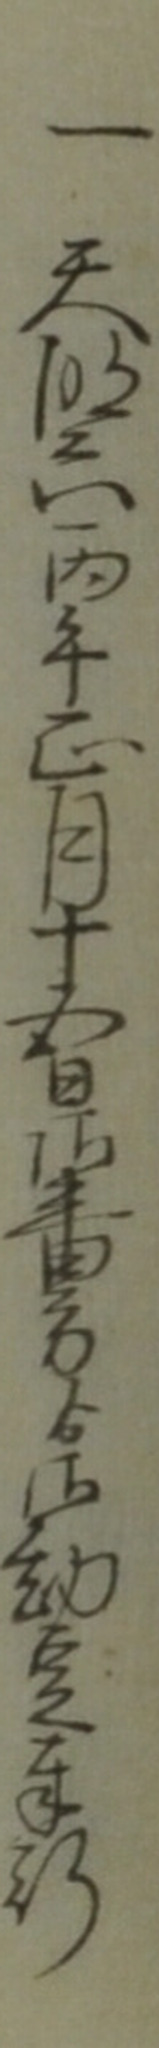一天明六丙午正月十五日御番方ゟ御勘定奉行
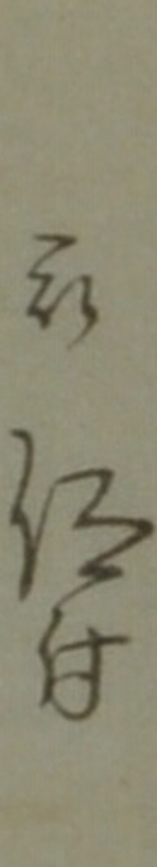被仰付
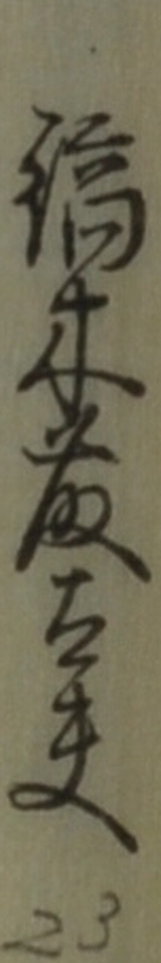縞木藤太夫
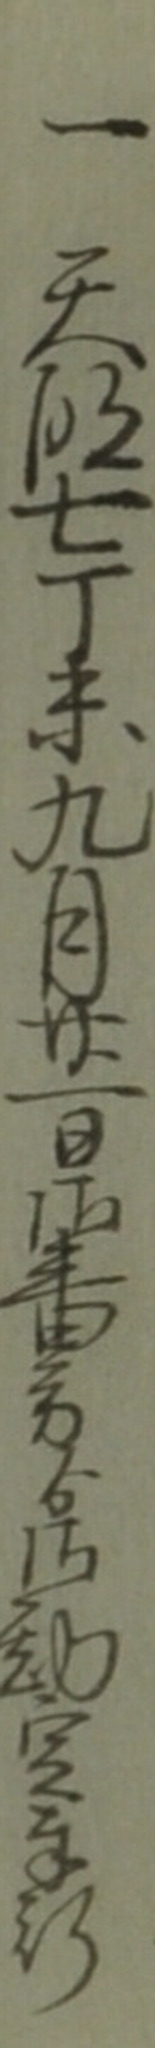一天明七丁未九月廿一日御番方ゟ御勘定奉行
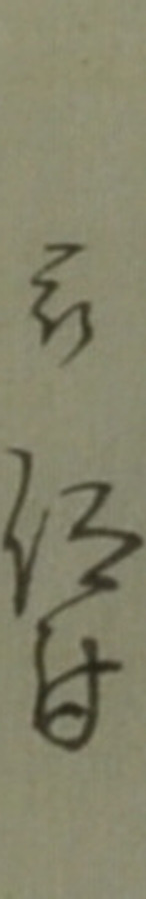被仰付
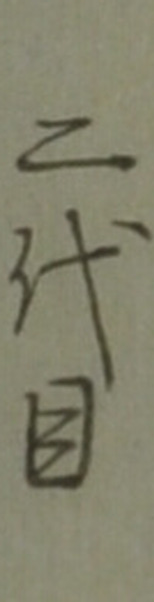二代目
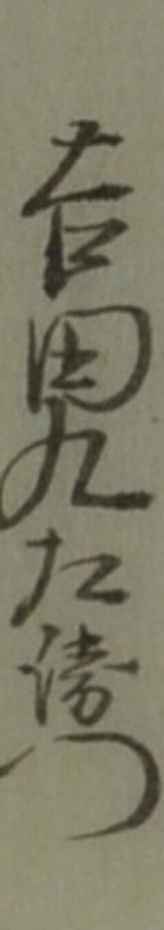吉田九左衛門
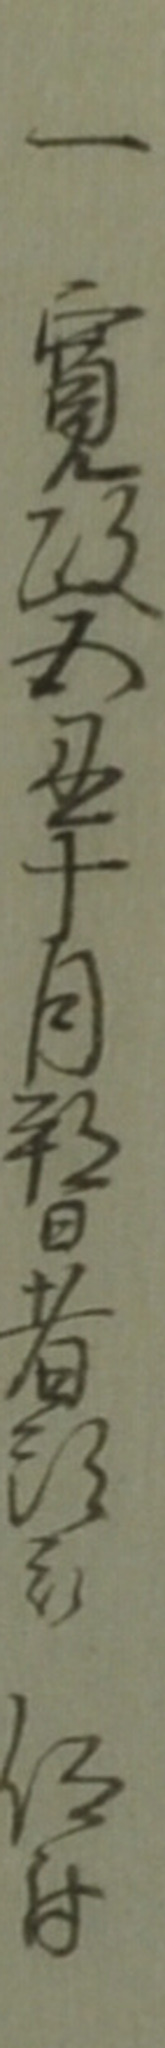一寛政五丑十月朔日者頭被仰付
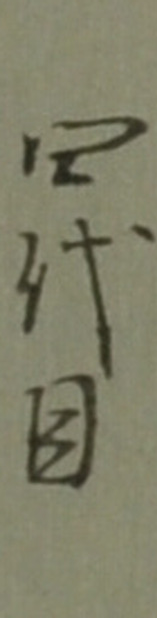四代目
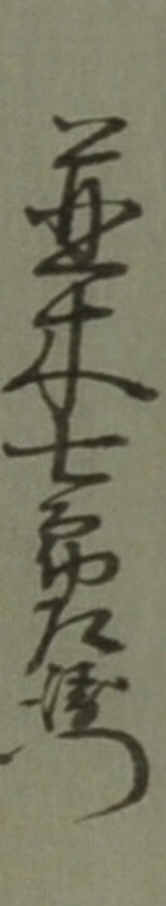並木七郎左衛門
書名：諸御役代々録（三）
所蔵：伊那市立高遠町図書館・合同会社AMANE
